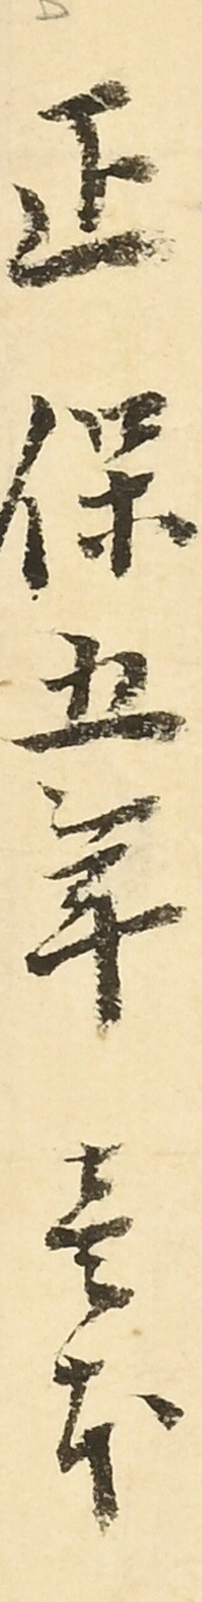。正保五年壱本
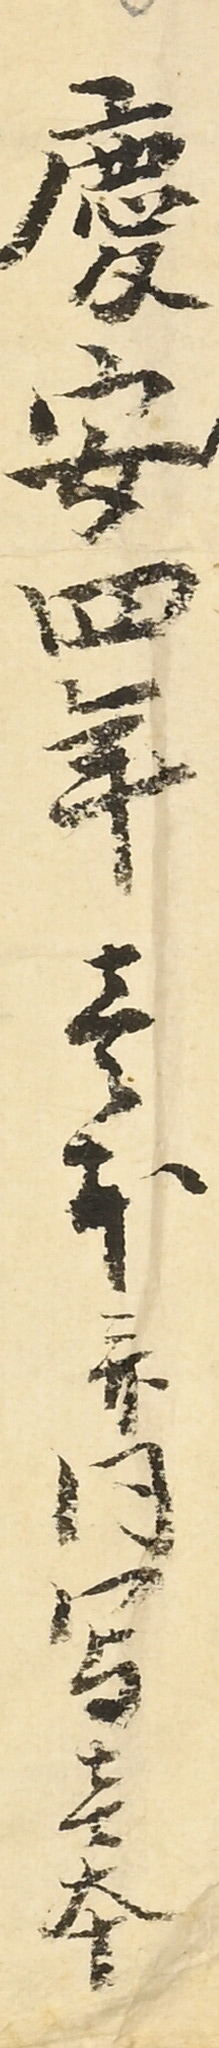。慶安四年壱本并同写壱本
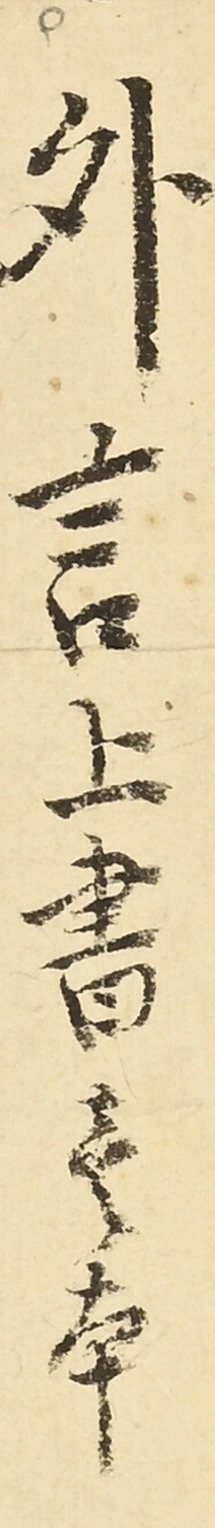。外言上書壱本

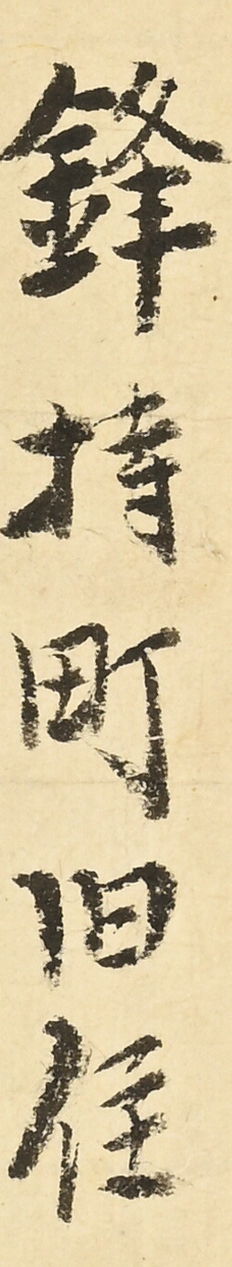鉾持町旧住
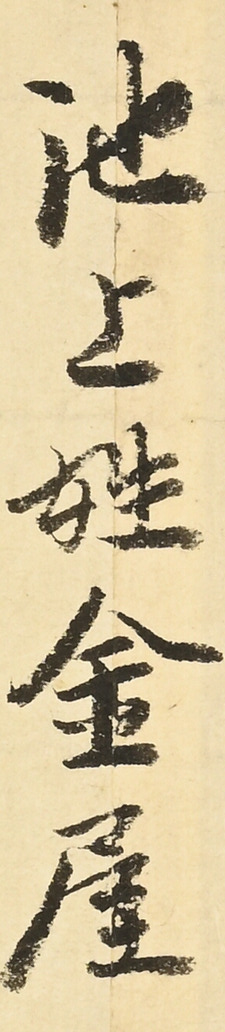池上姓金屋

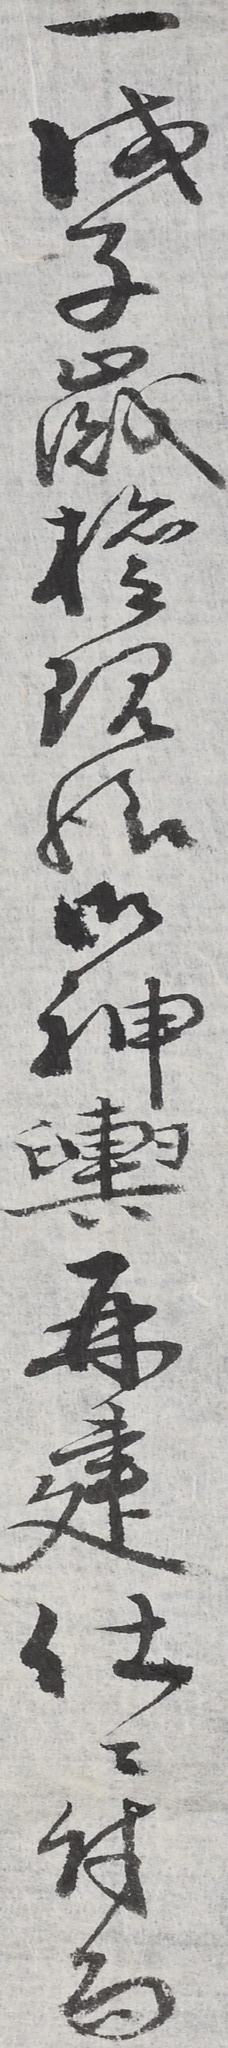一戊子歳権現様御神輿再建仕ニ付而
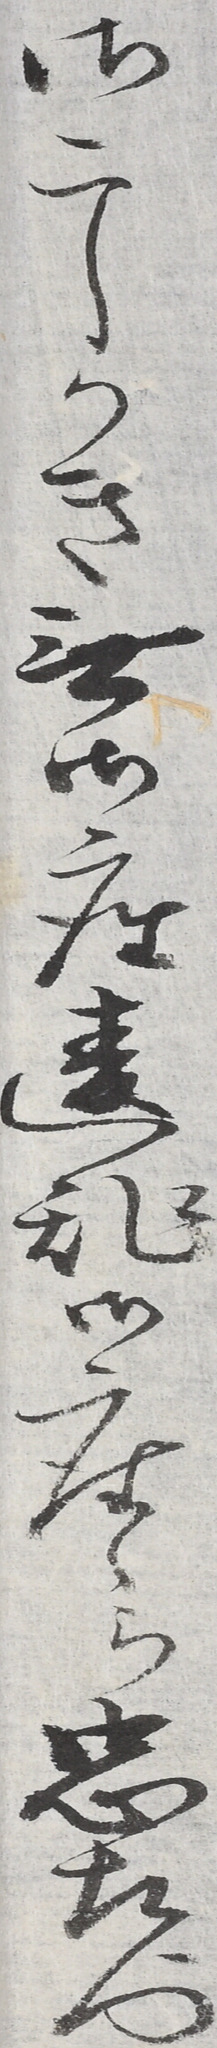御こしかき無御座違乱御座候而忠左衛門
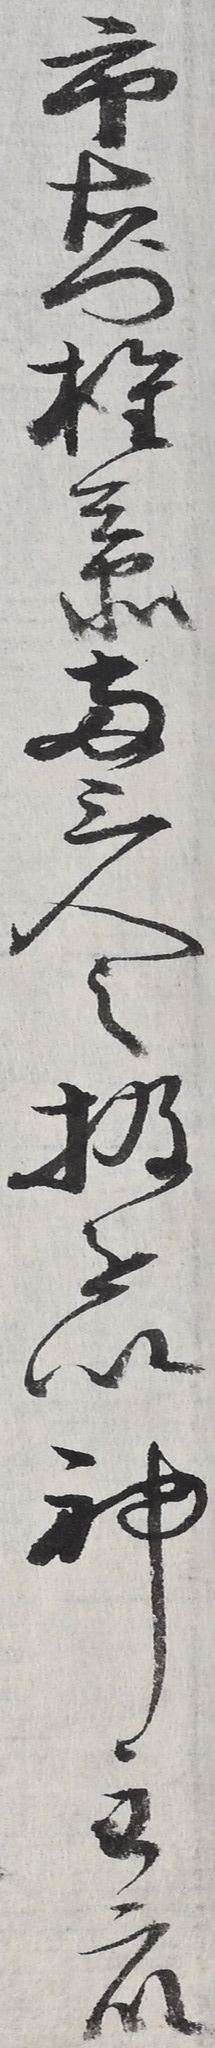市右衛門権兵衛両三人之扱を以神主衆
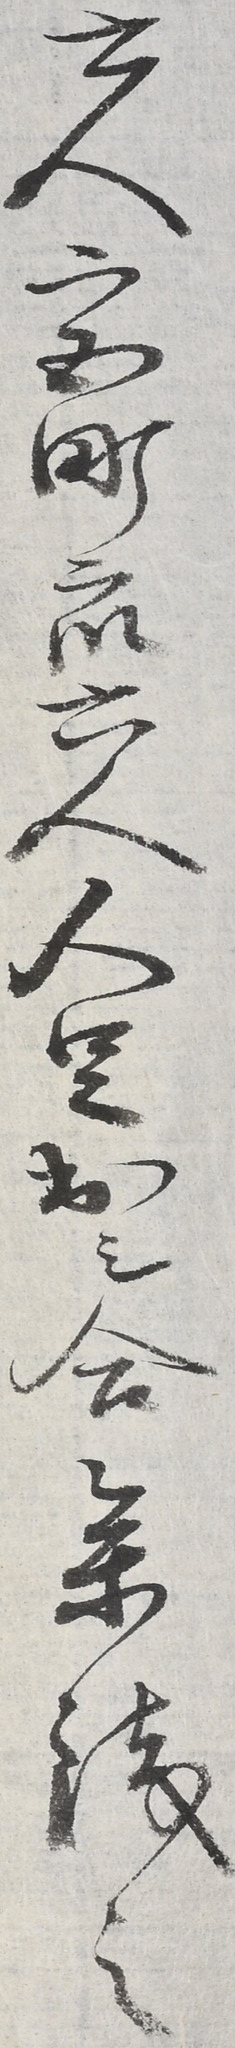六人宮町衆六人人足出シ合参銭之
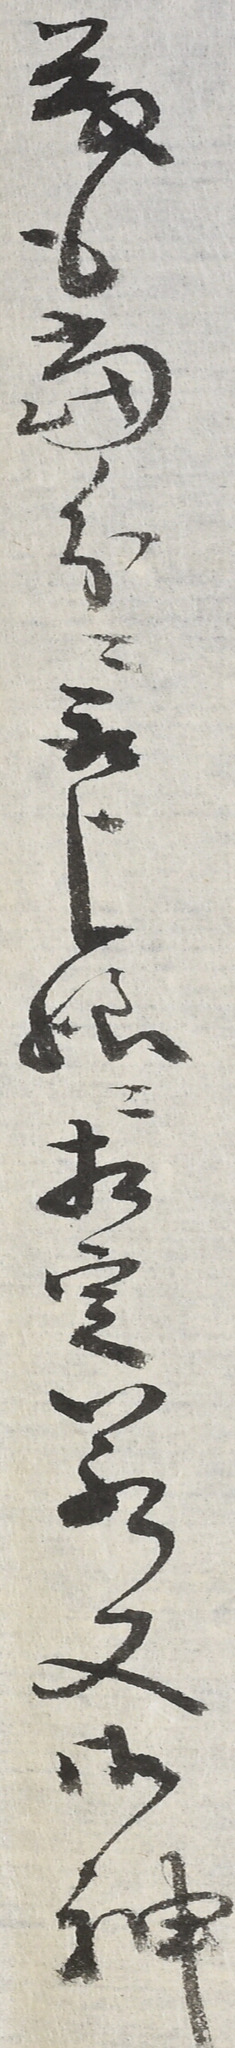義も当分ニ取申候様ニ相定若又御神
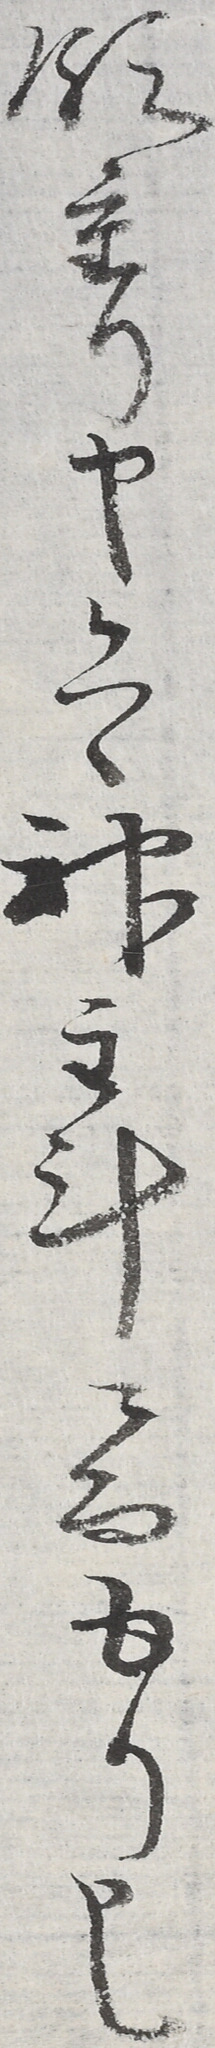領重り申候ハヽ神主計ニ而もり申候
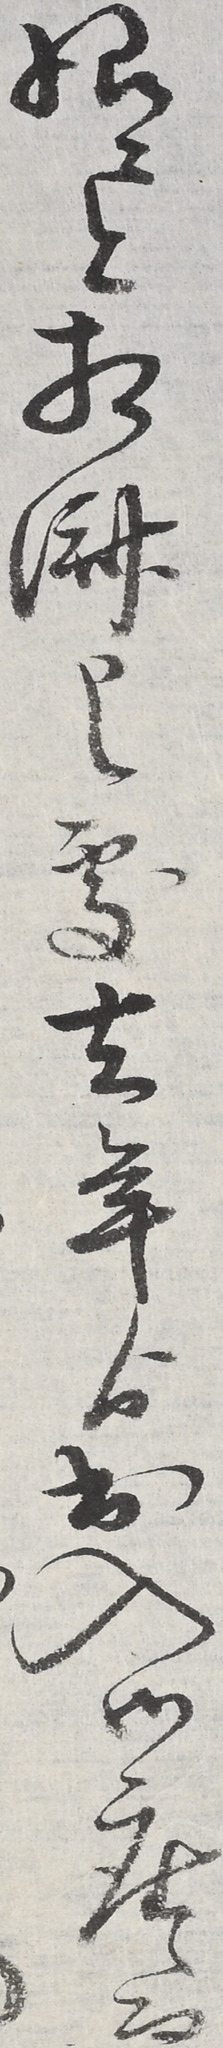様ニと相済申候処去年ゟ出入御座候而
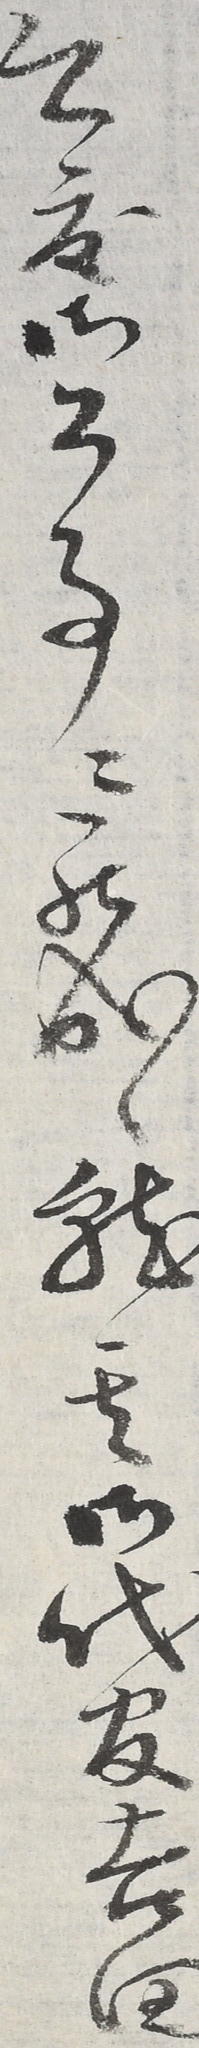今度御公事ニ罷成候就其御代官吉田
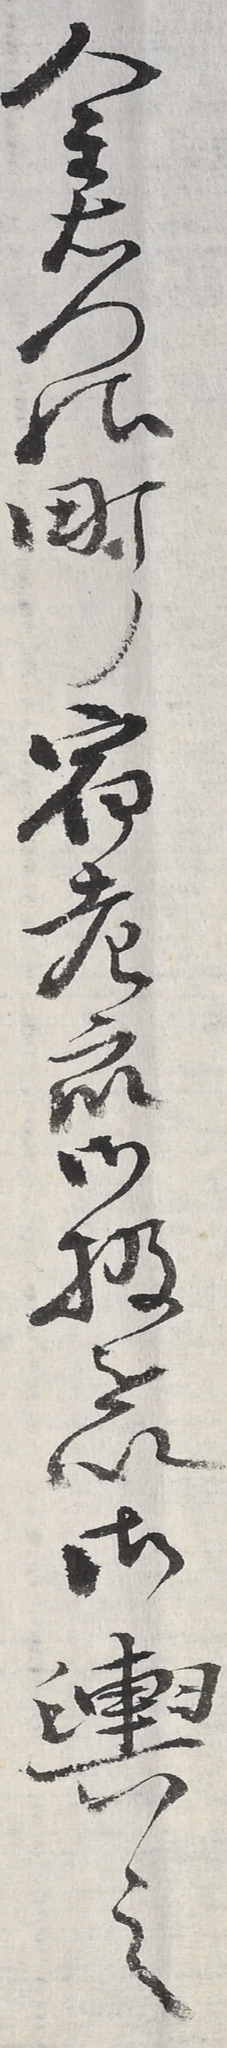金右衛門様町ノ宿老衆御扱を以御輿之
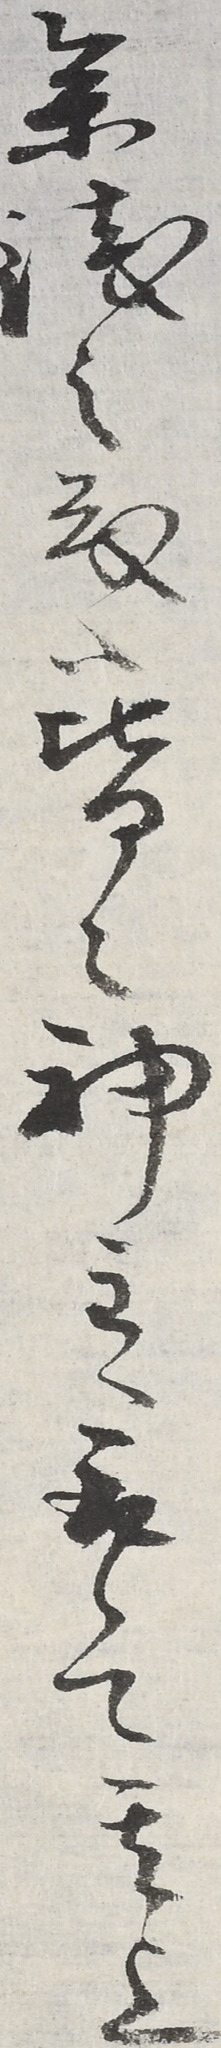参銭之義ハ皆々神主へ取候ハヽ其上
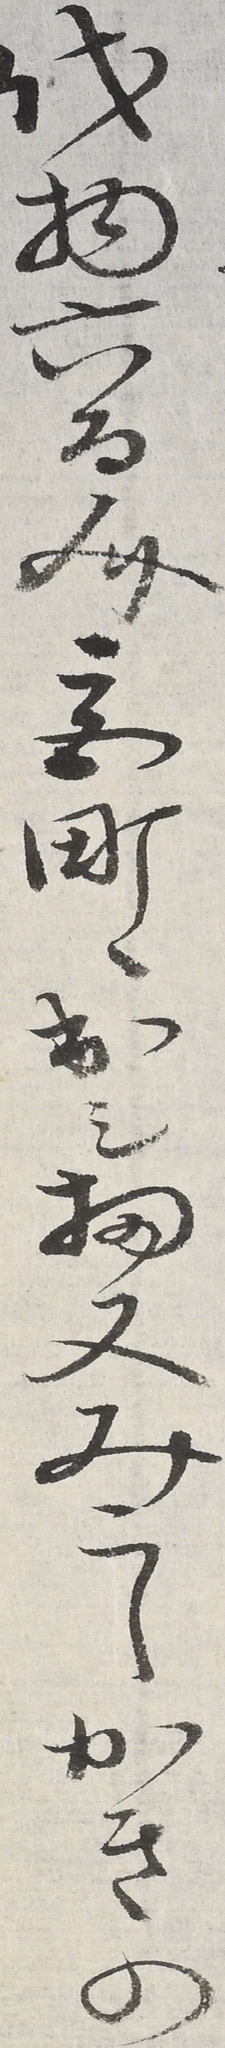代物六百文宮町へ出シ扨又みこしかきの
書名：旧記
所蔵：伊那市立高遠町図書館・合同会社AMANE
